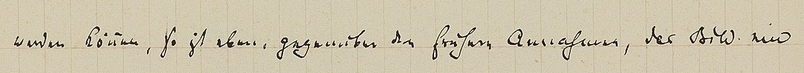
werden können, so ist eben, gegenüber den frühern Annahmen, das Bild ein
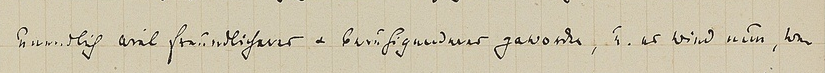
unendlich viel freundlicheres & beruhigenderes geworden, u. es wird nun, wer
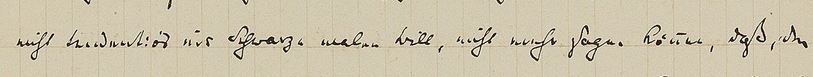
nicht tendentiös ins Schwarze malen will, nicht mehr sagen können, daß, der
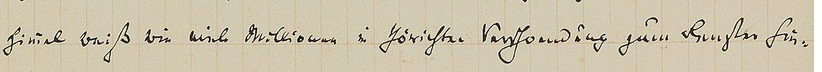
Himmel weiß wie viele Millionen in thörichter Verschwendung zum Fenster hin-
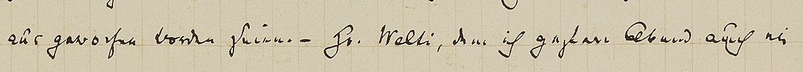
aus geworfen worden seien. – Hr. Welti, dem ich gestern Abend auch ein
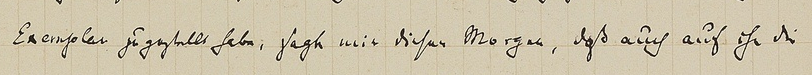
Exemplar zugestellt habe, sagte mir diesen Morgen, daß auch auf ihn die
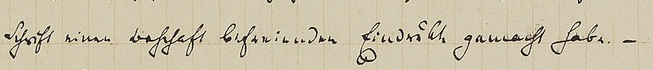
Schrift einen wahrhaft befreienden Eindrukk gemacht habe. –
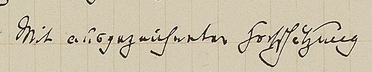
Mit ausgezeichneter Hochschätzung
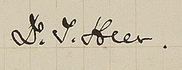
Dr J. Heer.
